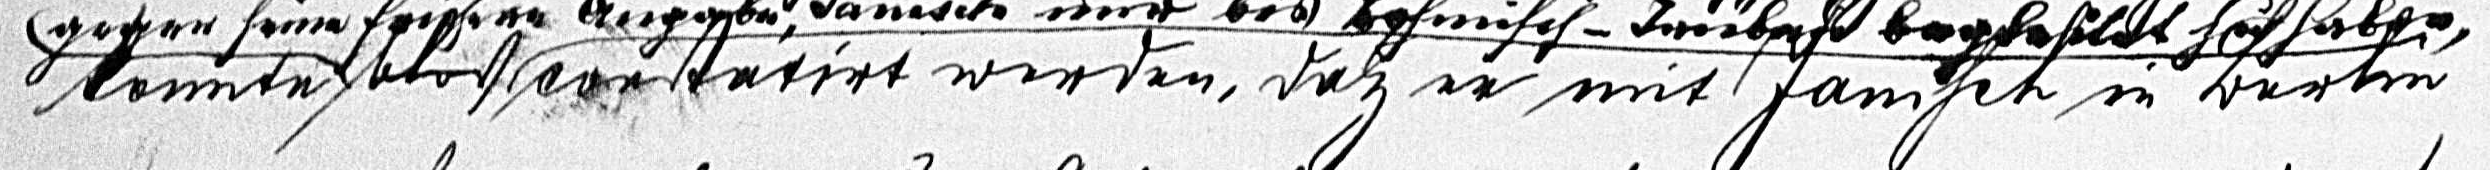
konnte bloß constatirt werden, daß er mit Janisch in Berlin
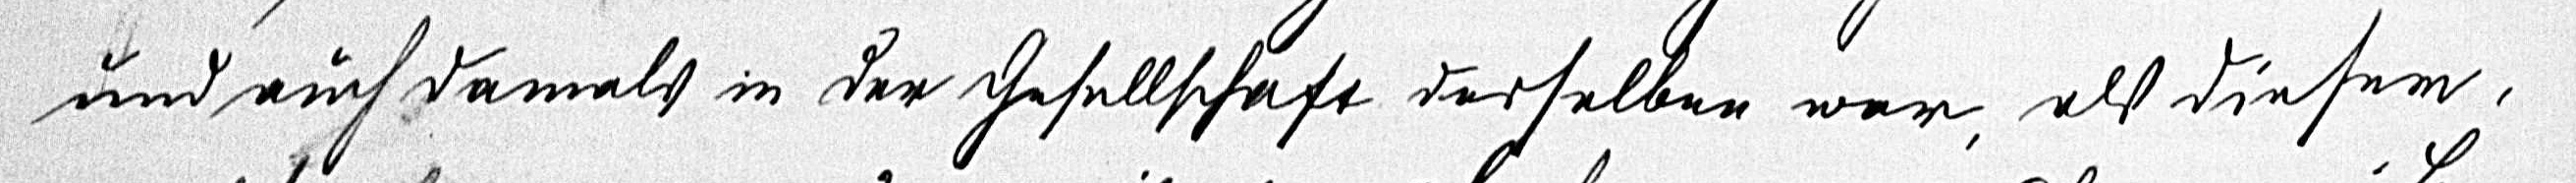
und auch damals in der Gesellschaft derselben war, als dieser
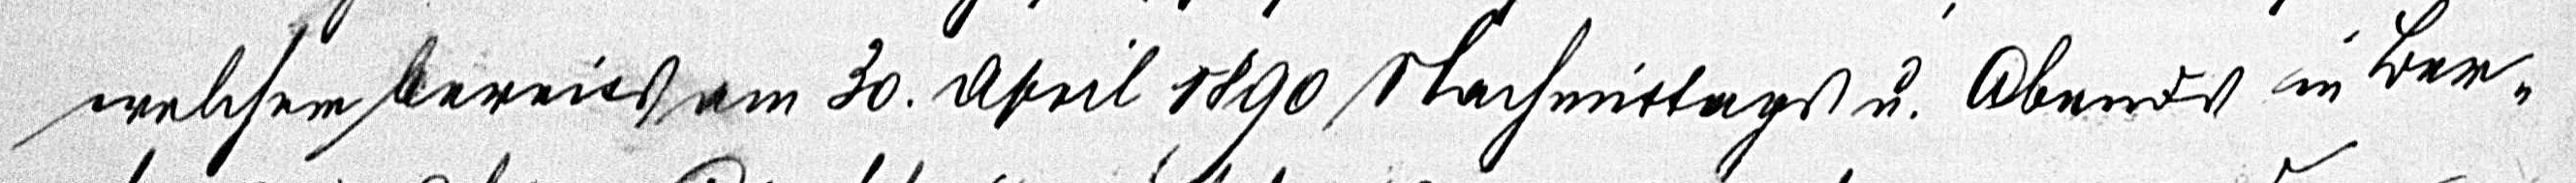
welcher bereits am 30. April 1890 Nachmittags und Abends in Ber¬
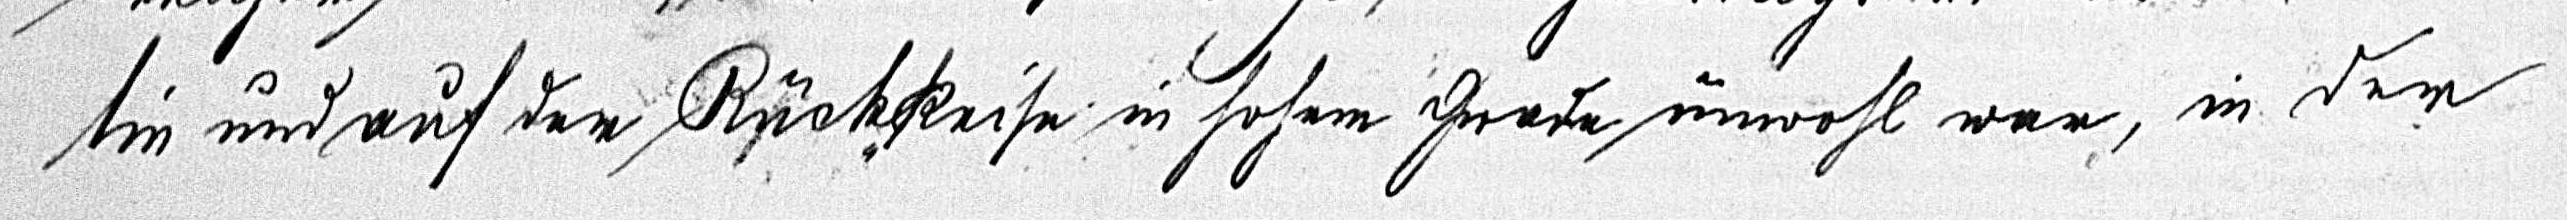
lin und auf der Rückreise in hohem Grade unwohl war, in der
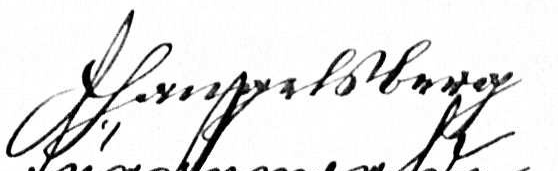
Hangelsburg
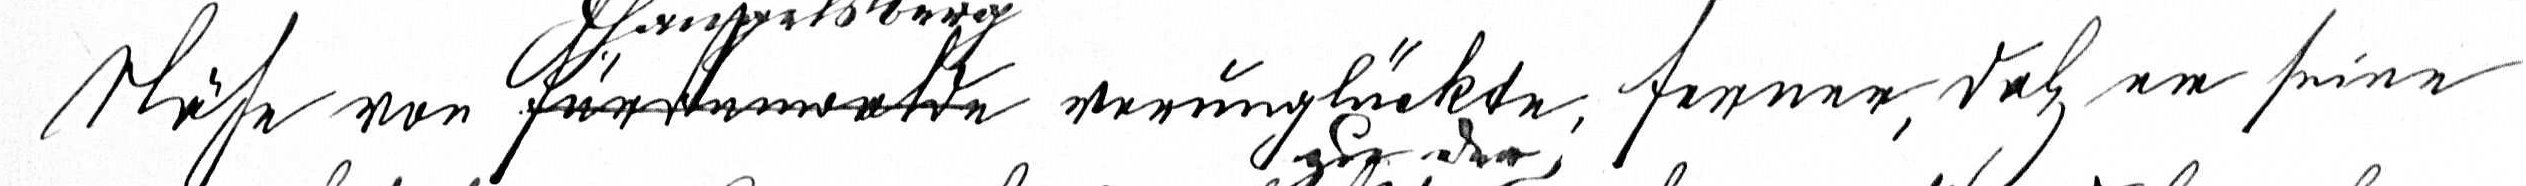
Nähe von verunglückte, ferner, daß er seine
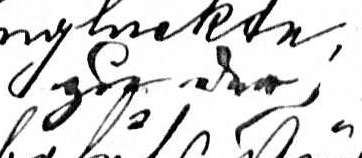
zu der
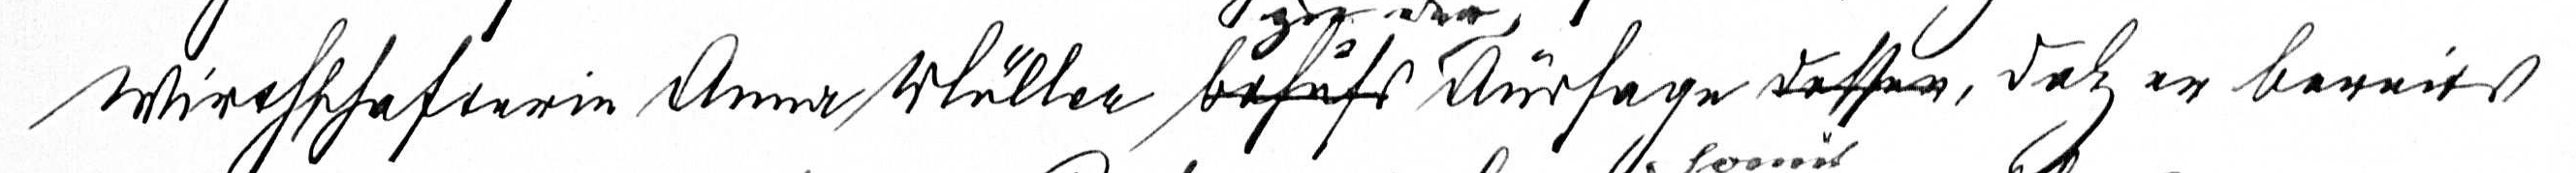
Wirthschafterin Anna Müller Aussage, daß er bereits
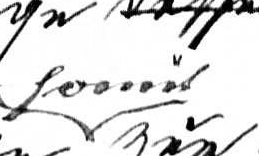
Somit
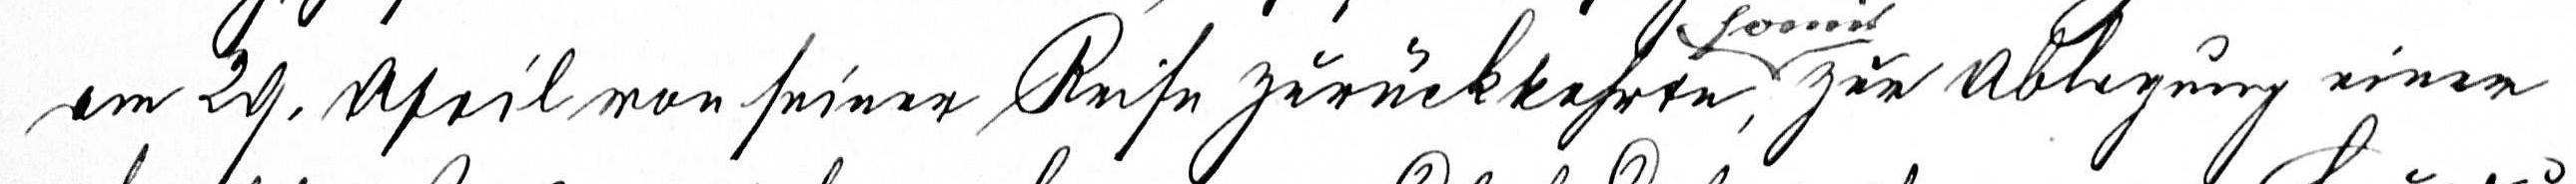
am 29. April von seiner Reise zurückkehrte, zur Ablegung einer
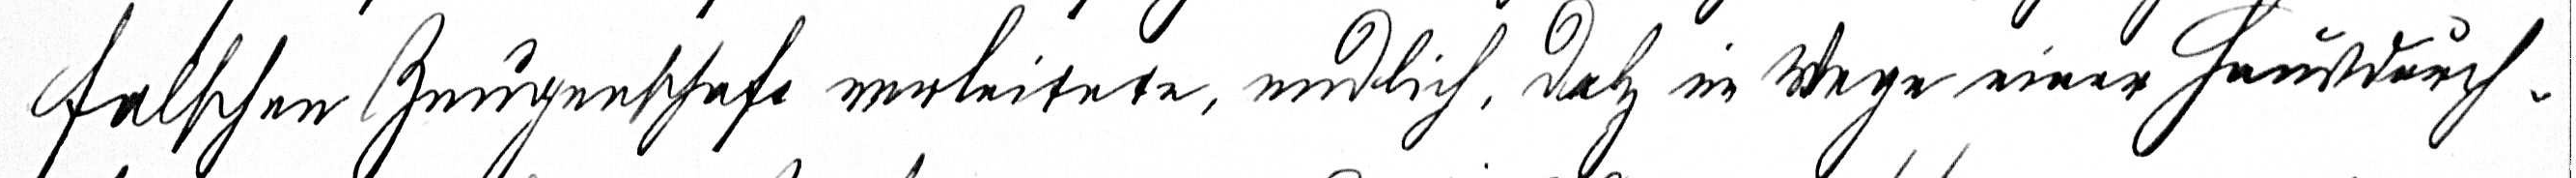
falscher Zeugenschaft verleitete, endlich, daß im Wege einer Hausdurch¬
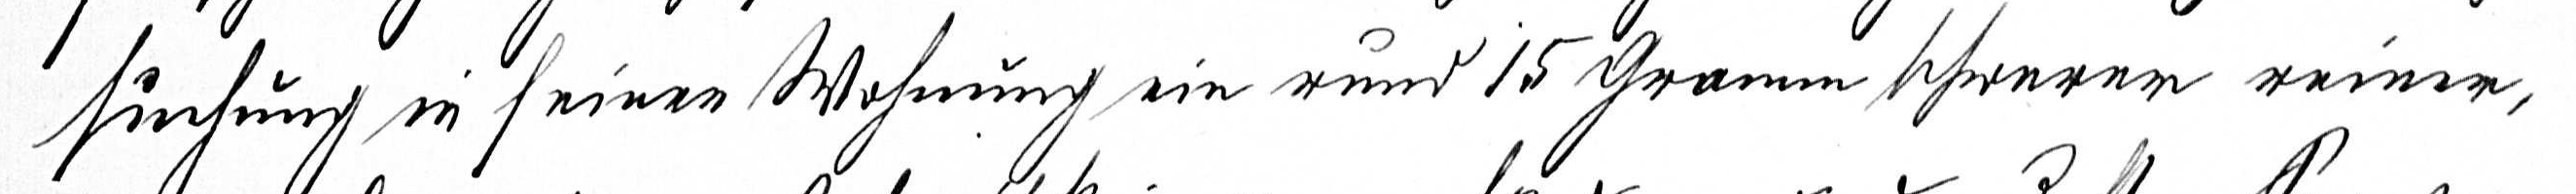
suchung in seiner Wohnung ein rund 15 Gramm schwerer reiner
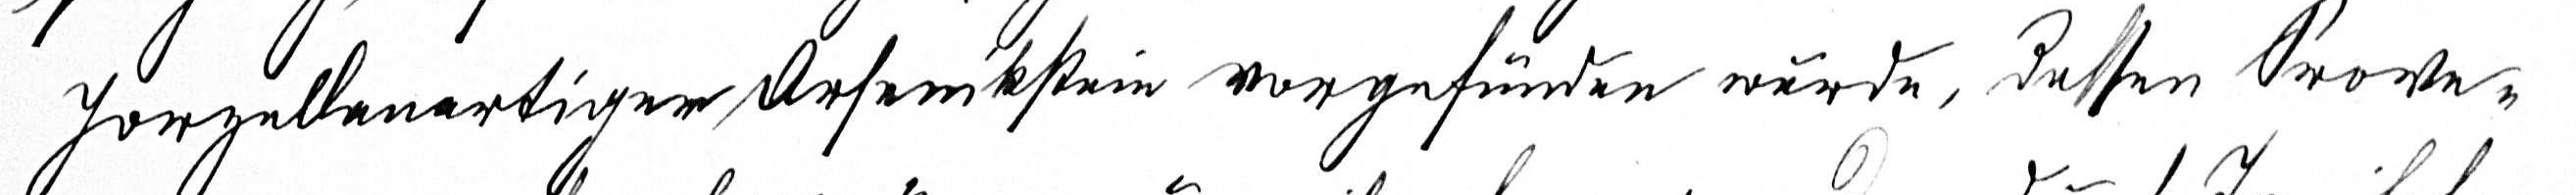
Porzellanartiger Arsenikstein vorgefunden wurde, dessen Prove¬
